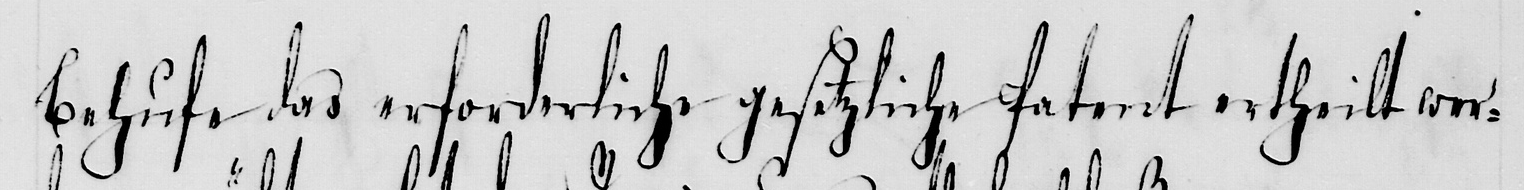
Behufe das erforderliche gesetzliche Patent ertheilt wer¬
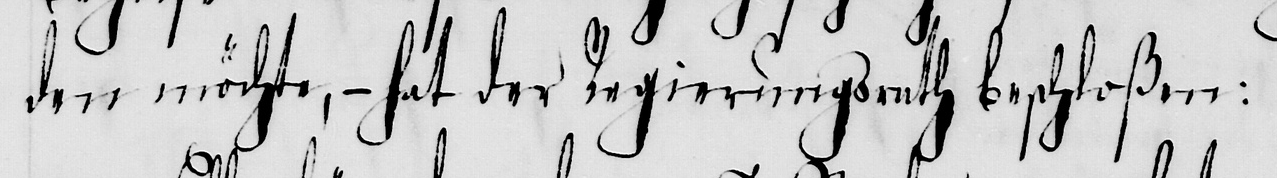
den möchte, – hat der Regierungsrath beschloßen:
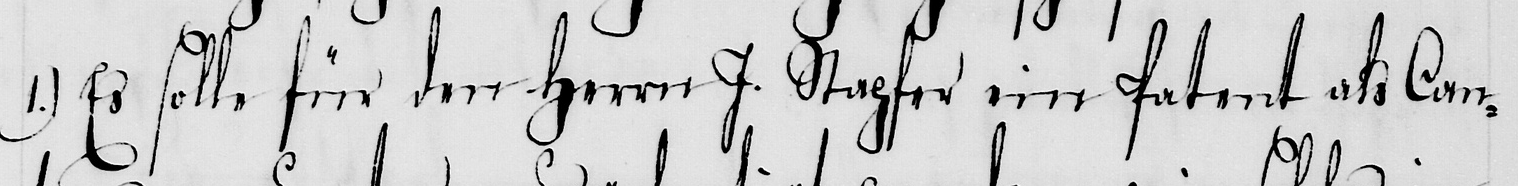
Es solle für den Herrn J. Stapfer ein Patent als Can¬
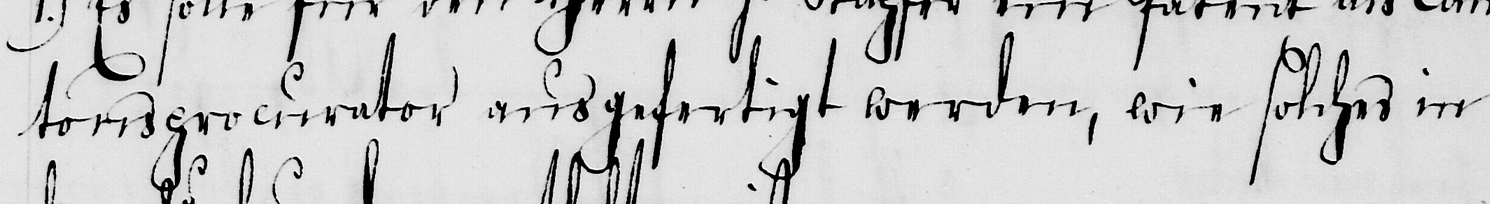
tonsprocurator ausgefertigt werden, wie solches in
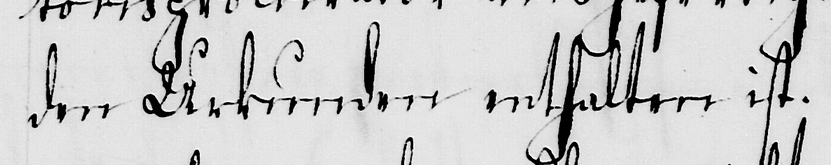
den Urkunden enthalten ist.
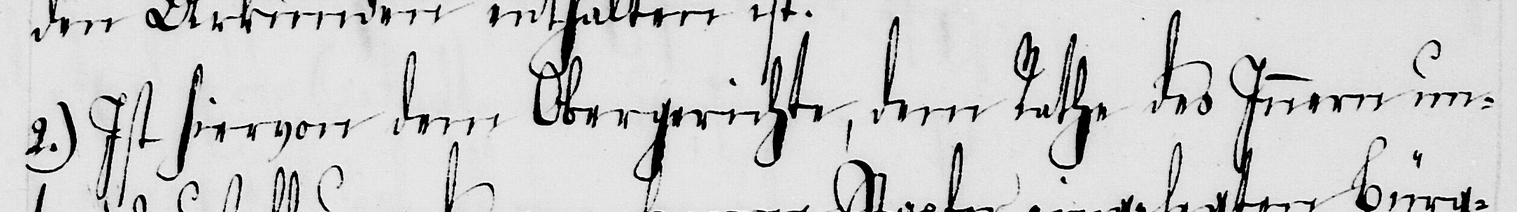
2.) Ist hiervon dem Obergerichte, dem Rathe des Innern un¬
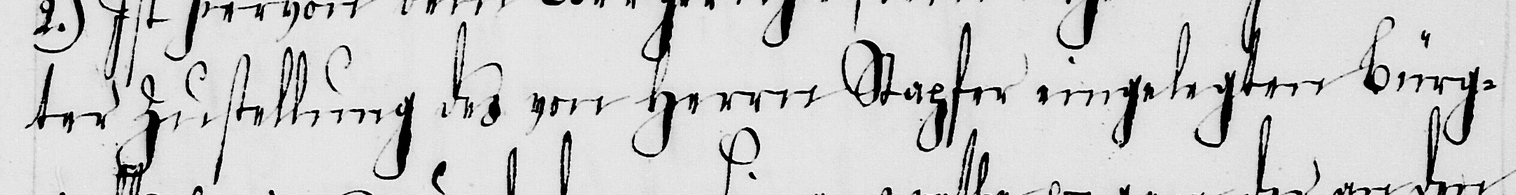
ter Zustellung des von Herrn Stapfer eingelegten Bürg¬
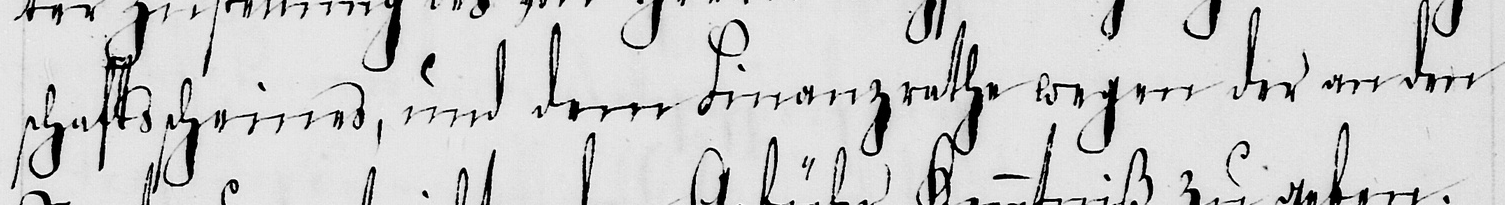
schaftsscheines, und dem Finanzrathe wegen der an den
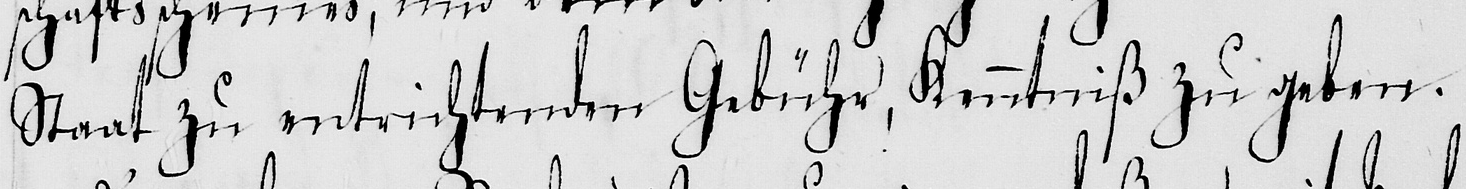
Staat zu entrichtenden Gebühr, Kenntniß zu geben.
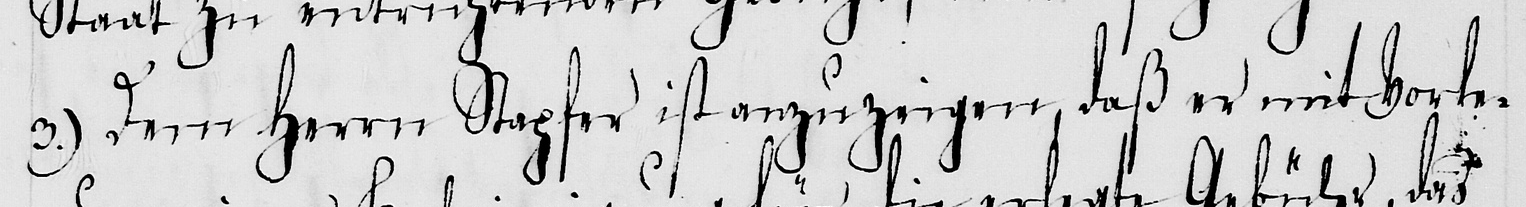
3.) Dem Herrn Stapfer ist anzuzeigen, daß er mit Vorle¬
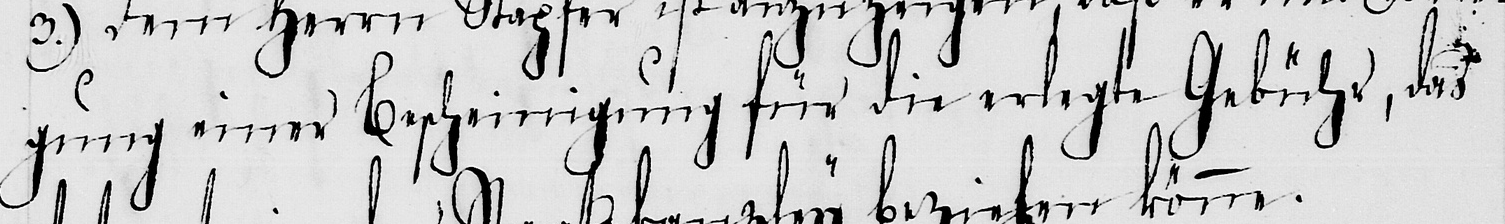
gung einer Bescheinigung für die erlegte Gebühr, das
